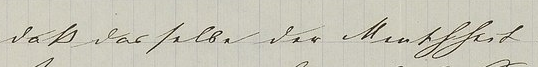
daß dasselbe der Menschheit &
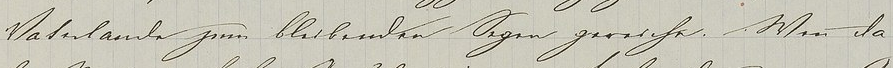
Vaterlande zum bleibenden Segen gereiche. Wenn da-
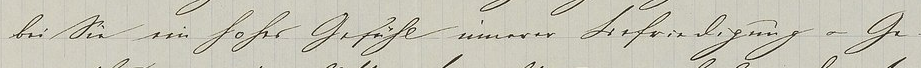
bei Sie ein hohes Gefühl innerer Befriedigung & Ge-
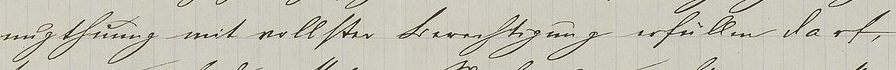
nugthuung mit vollster Berechtigung erfüllen darf,
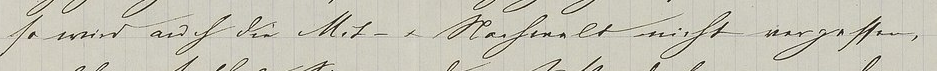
so wird auch die Mit- & Nachwelt nicht vergessen,
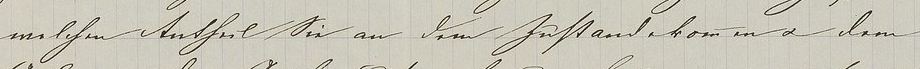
welchen Antheil Sie an dem Zustandekommen & dem
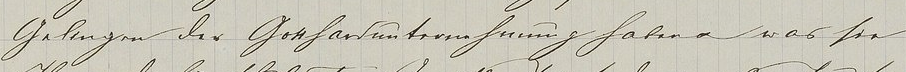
Gelingen der Gotthardunternehmung haben & was sie
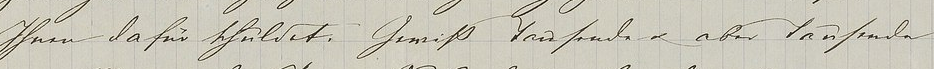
Ihnen dafür schuldet. Gewiß Tausende & aber Tausende
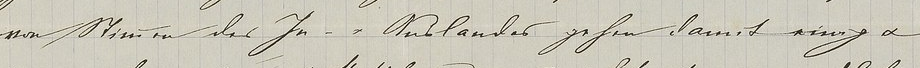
von Stimmen des In- & Auslandes gehen damit einig &
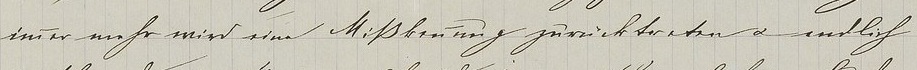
immer mehr wird eine Mißkennung zurücktreten & endlich
